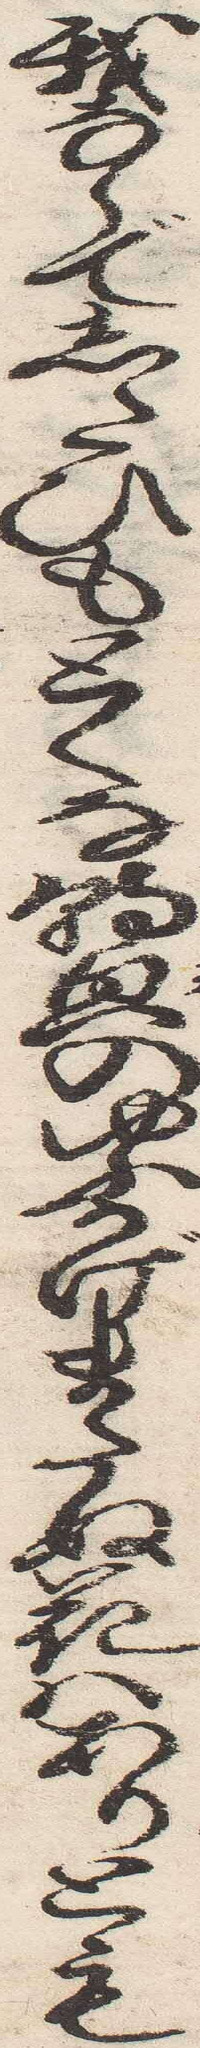我ならでしたひもとくな朝皃のゆふかげまたぬ花はありとも
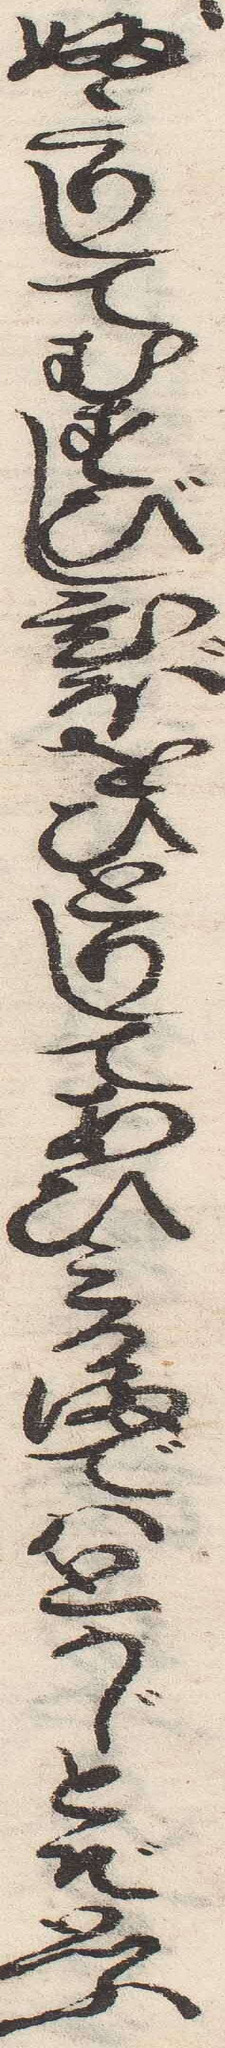ふたりしてむすびしひぼをひとりしてあひみるまではとかじとぞ思ふ
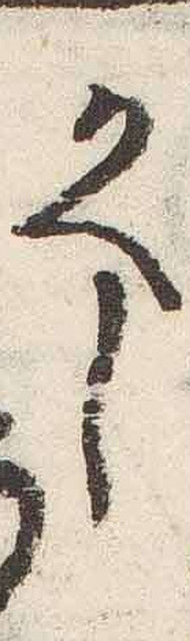かへし
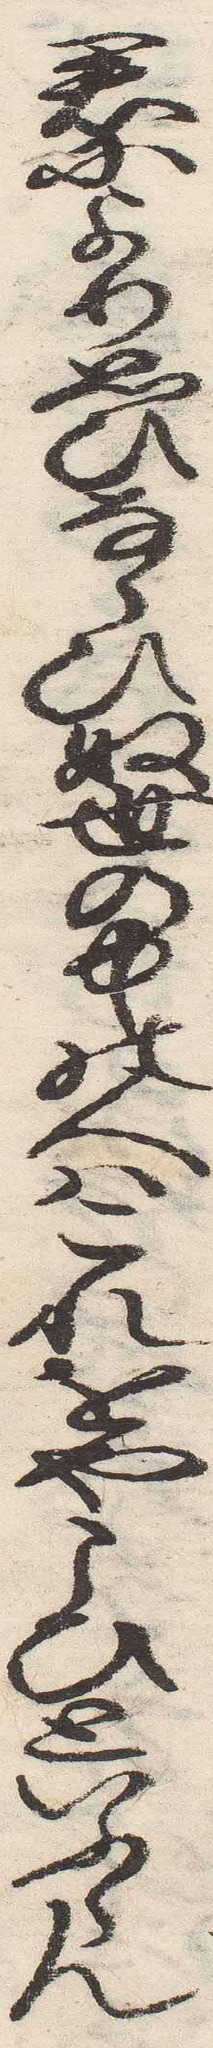君により思ひならひぬ世の中の人はこれをやこひといふらん

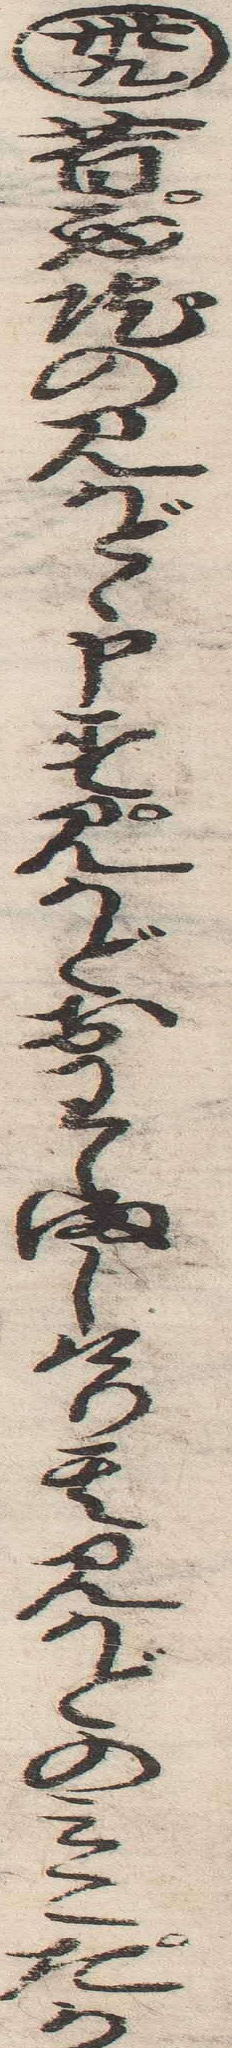卅九昔。西院のみかどゝ申す。みかどおわしましけり其みかどのみこ。たか
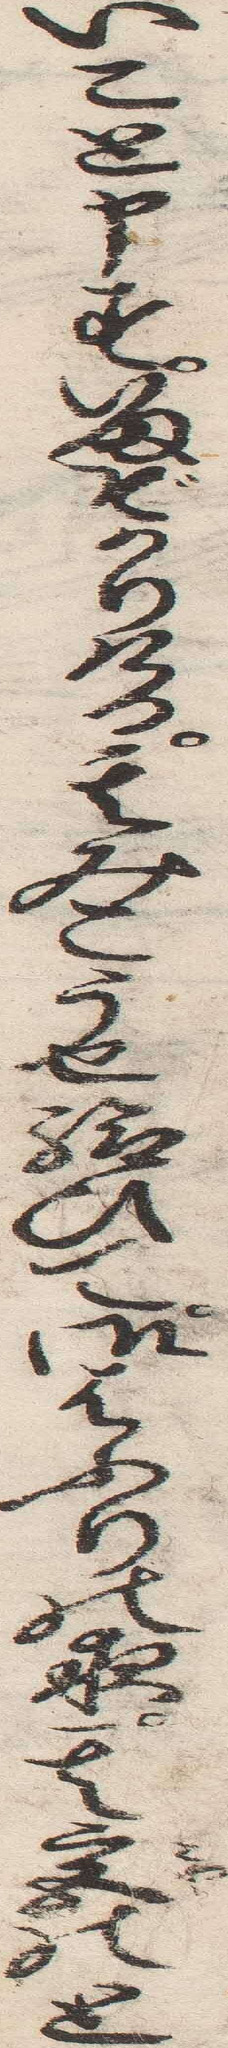いこと申す。いまぞかりける。其みこうせ給ひて。御はふりの夜。其宮のと
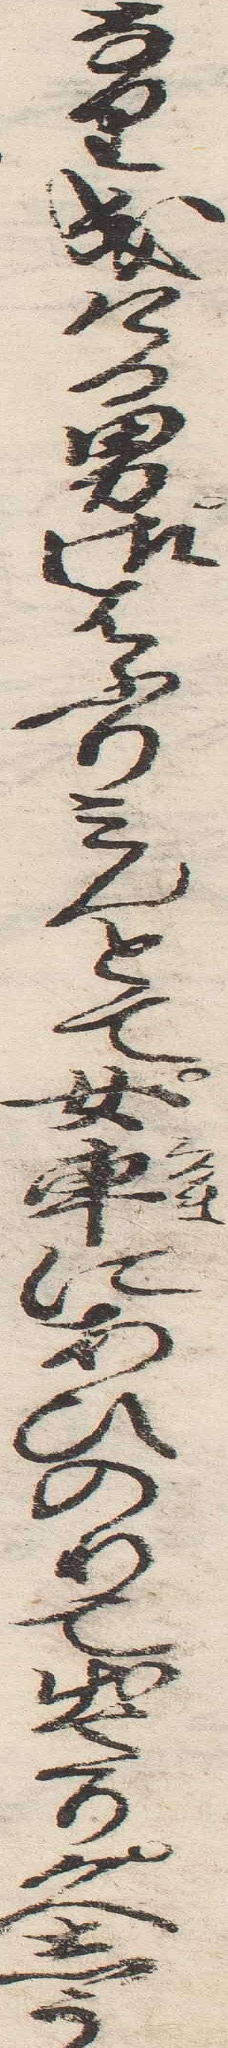なり成ける男。御はふりみんとて。女車にあひのりて出たり。久しう
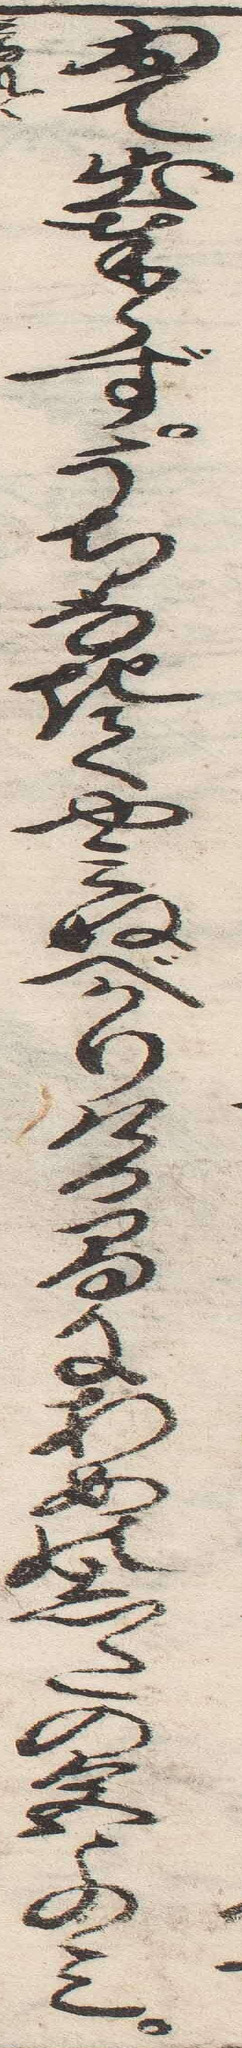ゐて出奉らず。うちなきてやみぬべかりける間にあめのしたの色このみ。
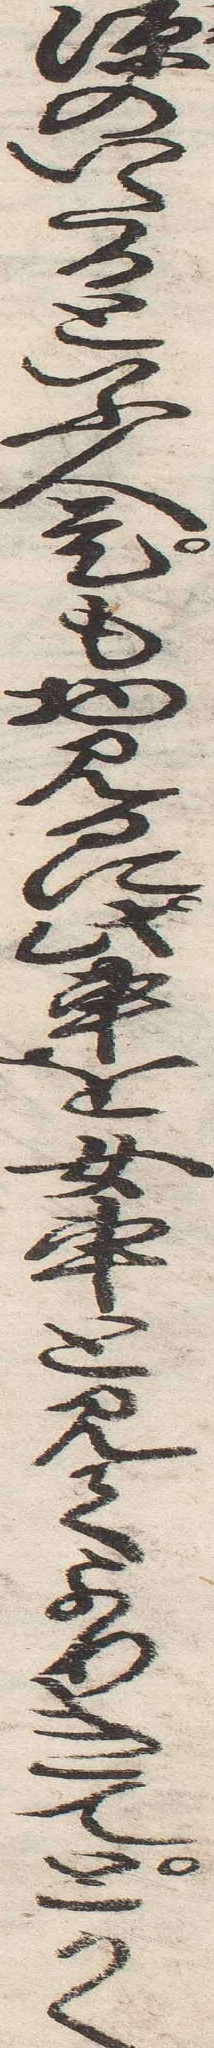源のいたるといふ人。是も物見るに。此車を女車と見てよりきて。とかく
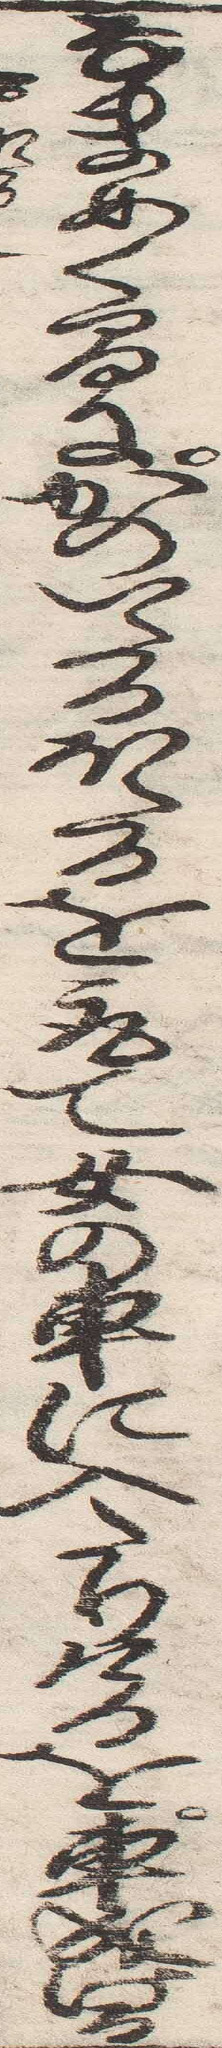なまめく間に。かのいたるほたるを取て女の車に入たりけるを。車成ける
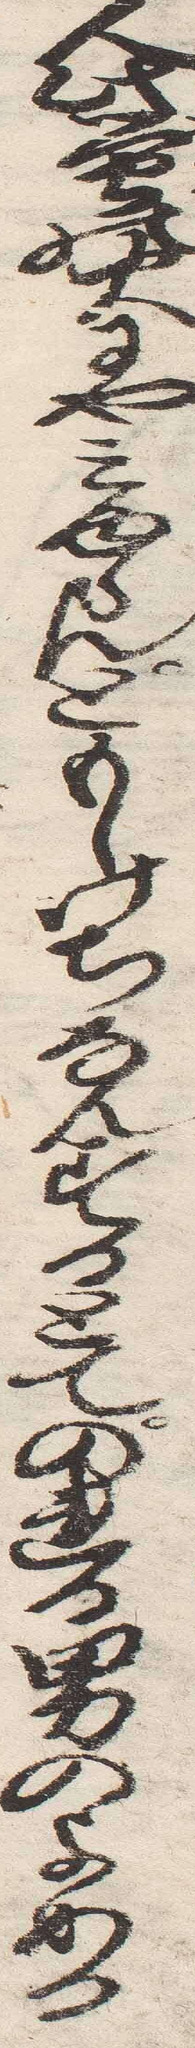人。此蛍の火にやみゆらんと。ともしけちなんするとて。のれる男のよめる
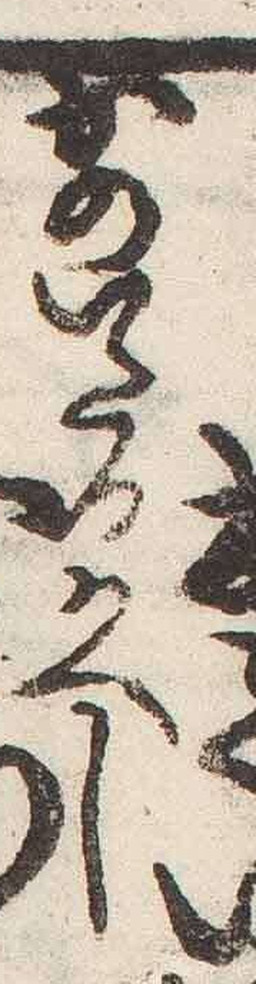かのいたるかへし
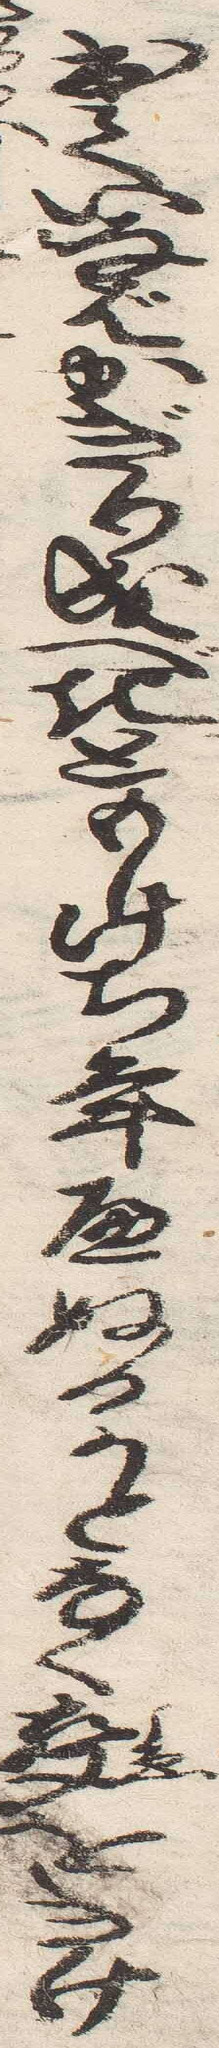出ていなばかぎり成べきともしけち年へぬるかとなく声をきけ
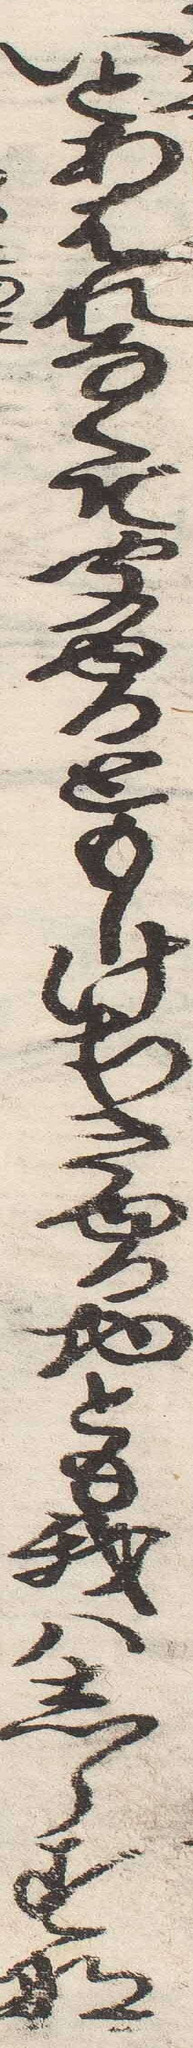いとあはれなくぞ聞ゆるともしけちきゆる物とも我はしらずな
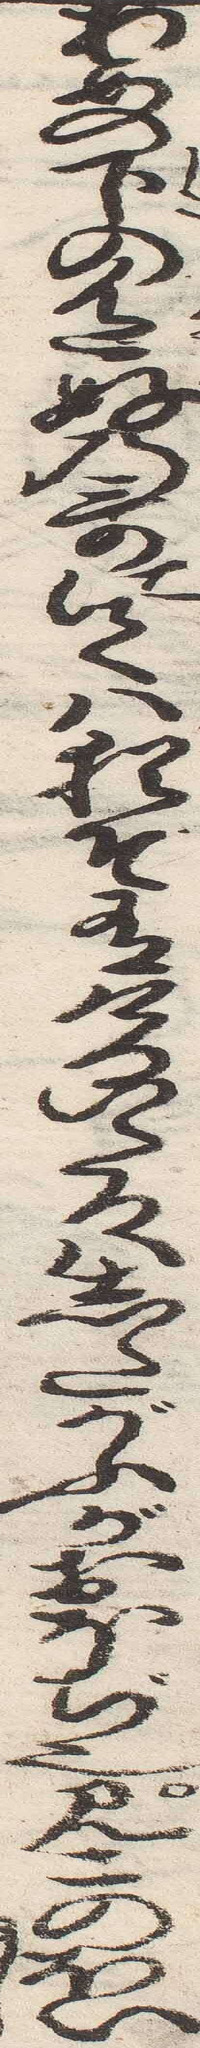あめの下の色好の哥にては。猶そ有けるいたるはしたがふがおほぢ也。みこのほいなし
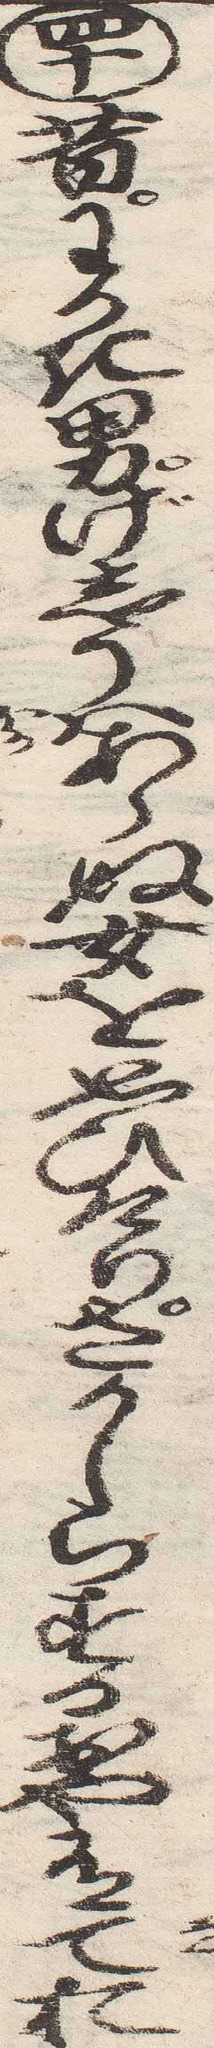四十昔。わかき男。げしうはあらぬ女を思ひけり。さかしらするおや有てお
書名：伊勢物語
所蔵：東京学芸大学附属図書館 国文学研究資料館
